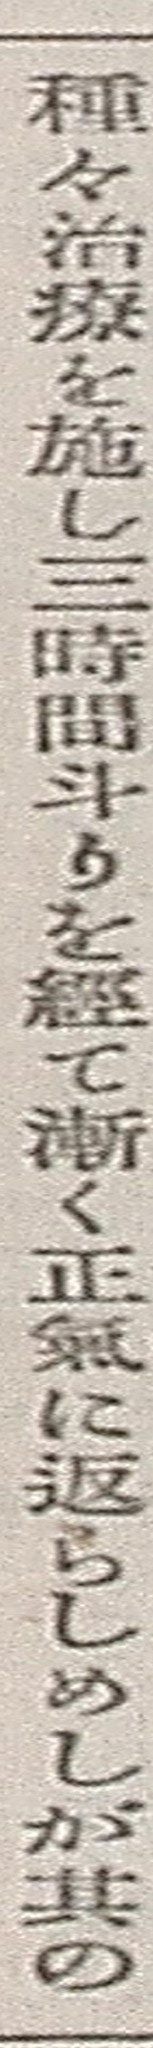種々治療を施し三時間斗りを経て漸く正気に返らしめしが其の
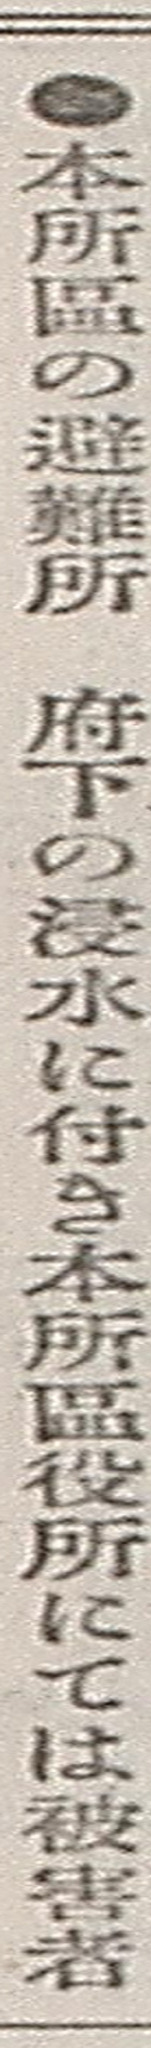●本所区の避難所府下の浸水に付き本所区役所にては被害者
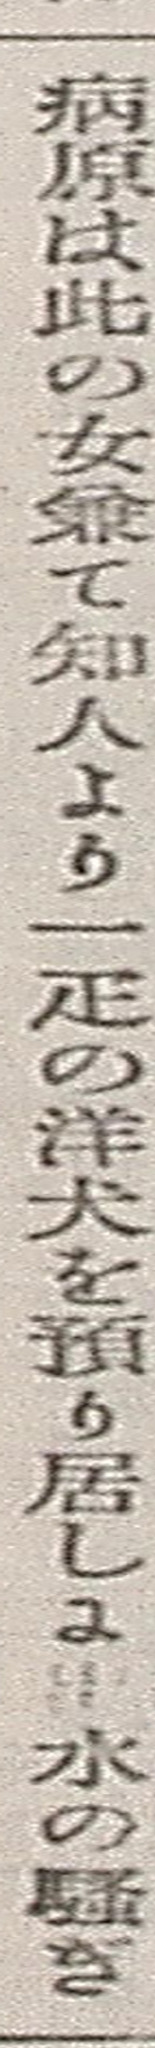病原は此の女兼て知人より一疋の洋犬を預り居しに出水の騒ぎ
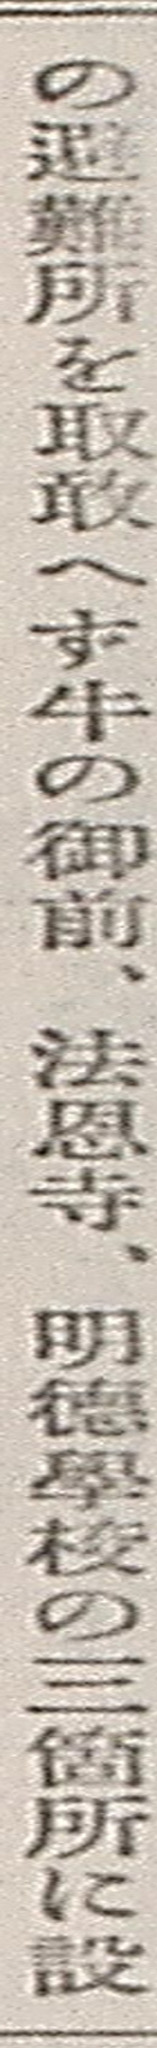の避難所を取敢へず牛の御前、法恩寺、明徳学校の三箇所に設
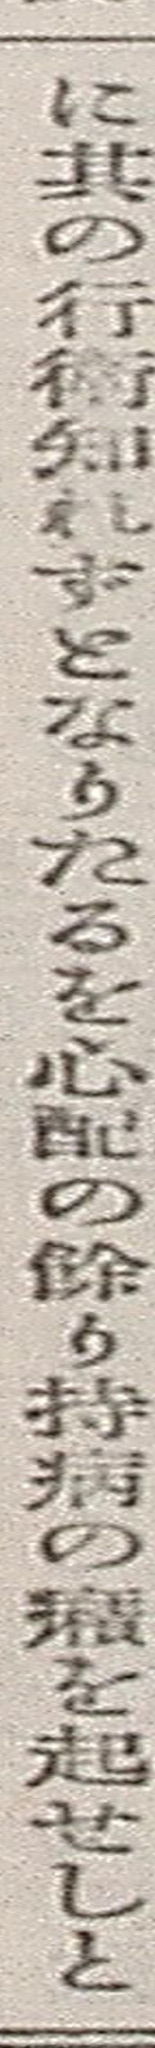に其の行衛知れずとなりたるを心配の余り持病の癪を起せしと
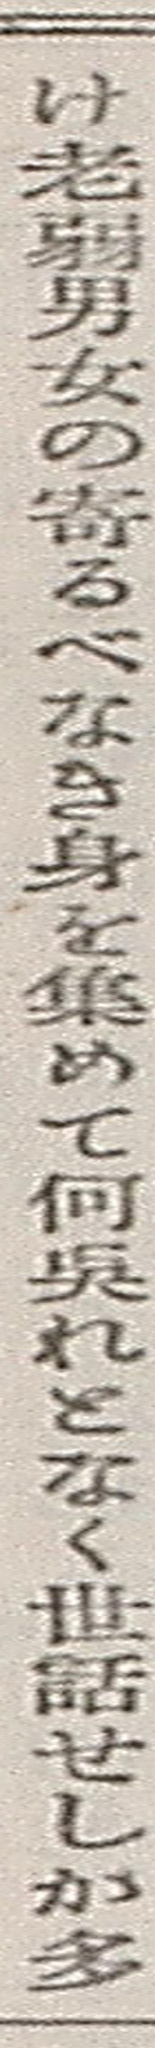け老若男女の寄るべなき身を集めて何呉れとなく世話せしか多
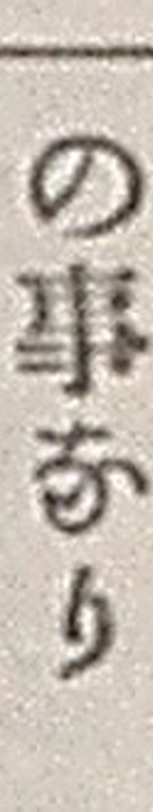の事なり
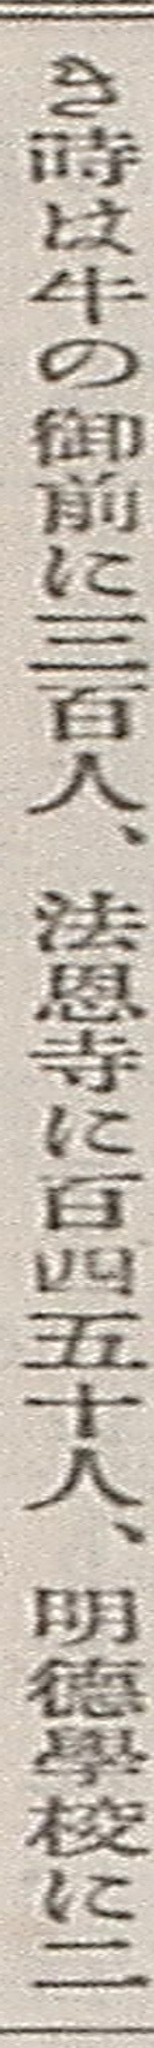き時は牛の御前に三百人、法恩寺に百四五十人、明徳学校に二
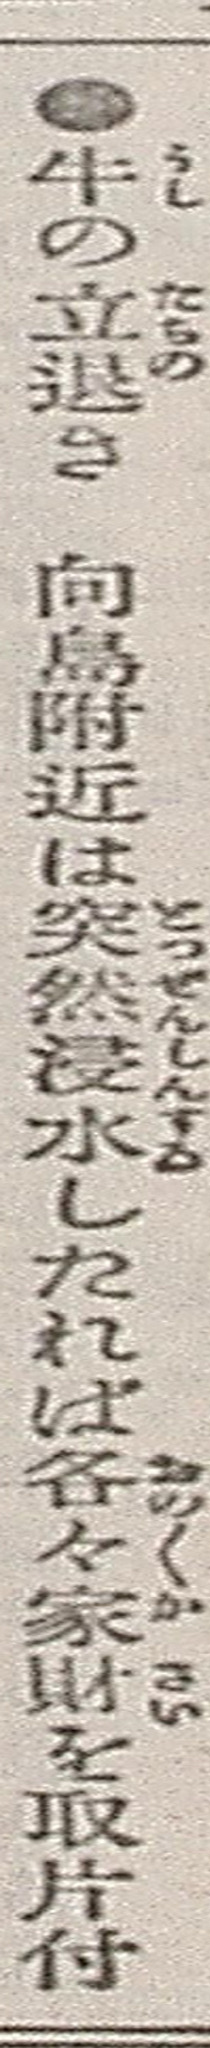●牛の立退き向島附近は突然浸水したれば各々家財を取片付
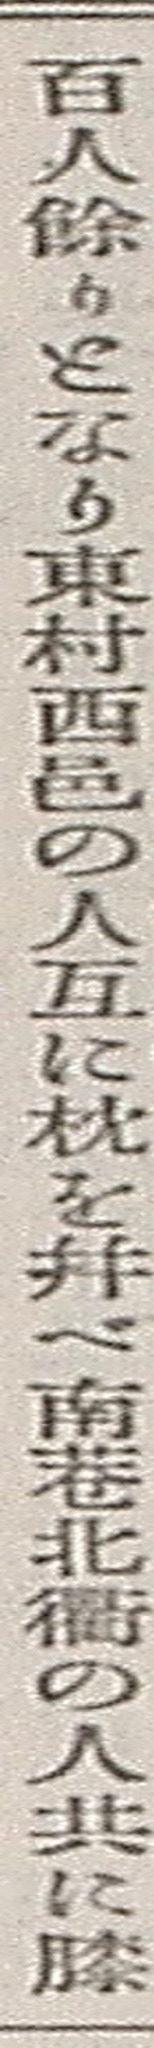百人餘りとなり東村西邑の人互に枕を幷べ南巷北衢の人共に膝
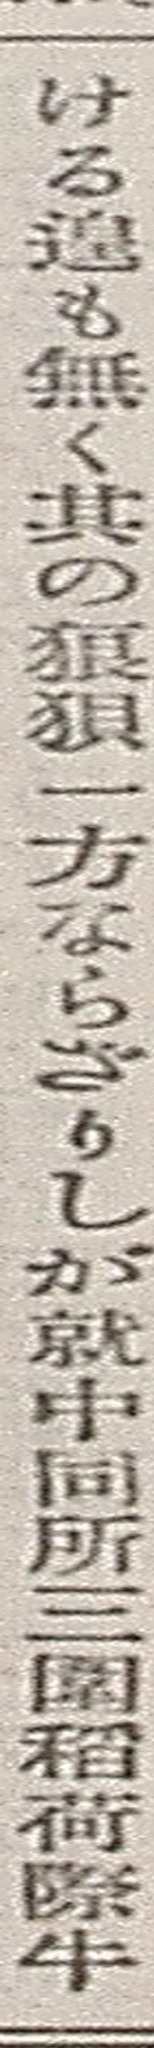ける遑も無く其の狼狽一方ならざりしが就中同所三囲稲荷際牛
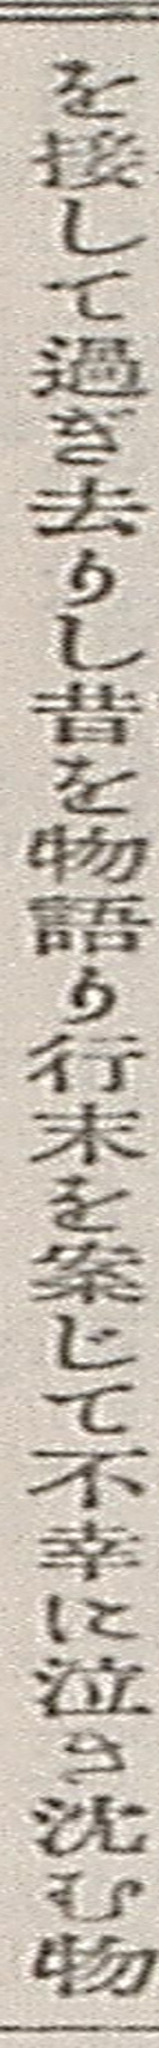を接して過ぎ去りし昔を物語り行末を案じて不幸に泣き沈む物
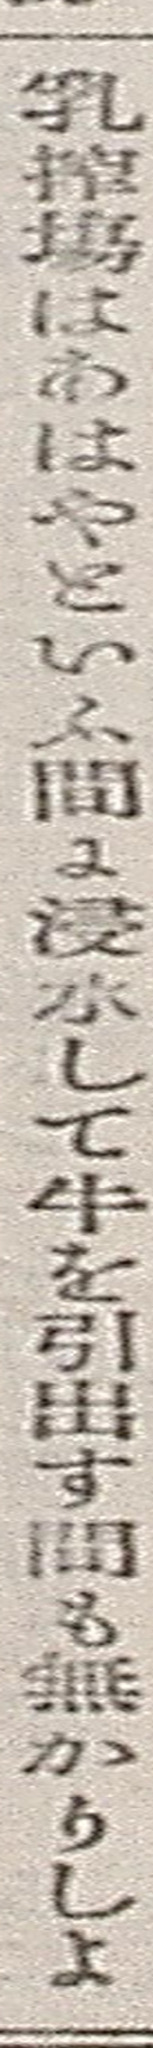乳搾場はあはやといふ間に浸水して牛を引出す間も無かりしよ
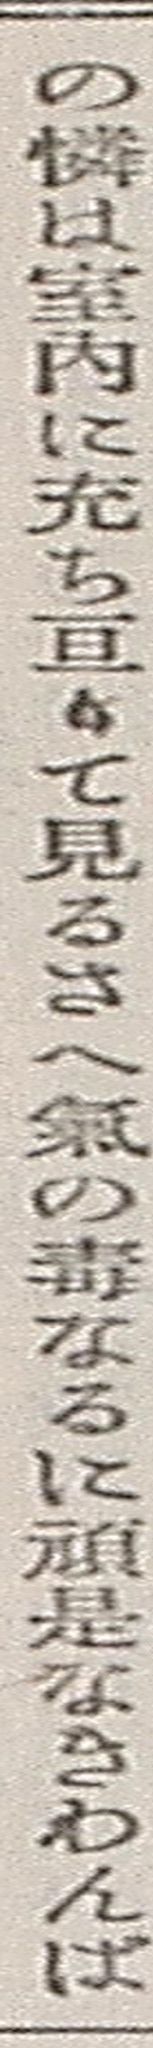の憐は室内に充ち亘りて見るさへ気の毒なるに頑是なきわんば
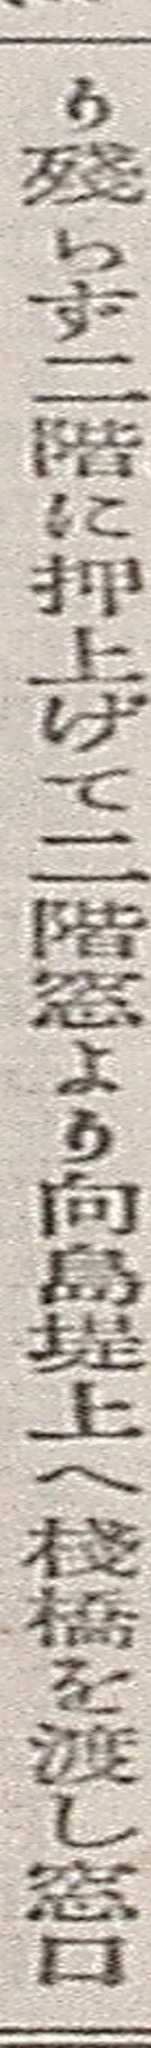り残らず二階に押上げて二階窓より向島堤上へ桟橋を渡し窓口
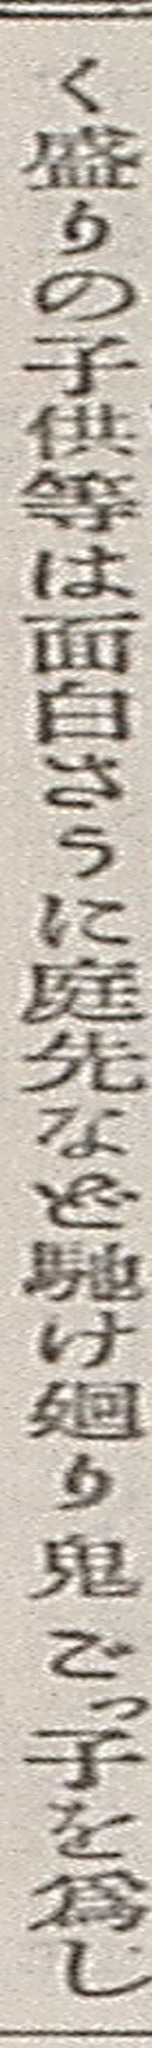く盛りの子供等は面白さうに庭先など馳け廻り鬼ごっ子を為し
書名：風俗畫報臨時増刊第百二十四號　洪水地震被害録（上）
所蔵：東京大学地震研究所図書室 Earthquake Research Institute Library, The University of Tokyo, JAPAN
